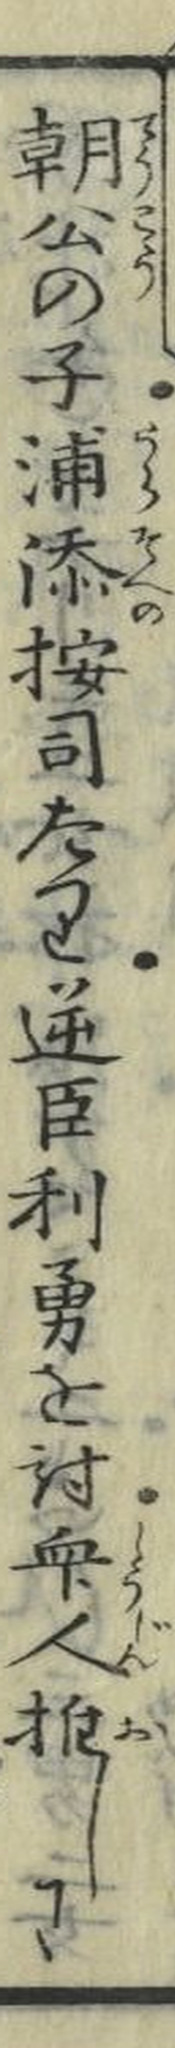朝公の子・浦添按司たり・逆臣利勇を討・衆人推して
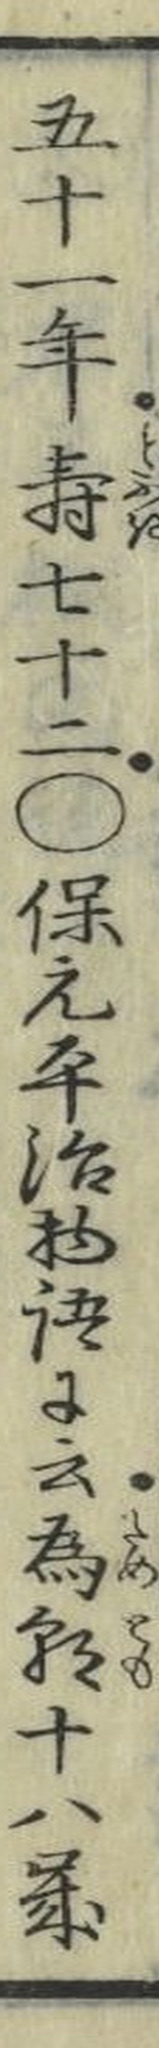五十一年・壽七十二・〇保元平治物語に云・為朝十八歳
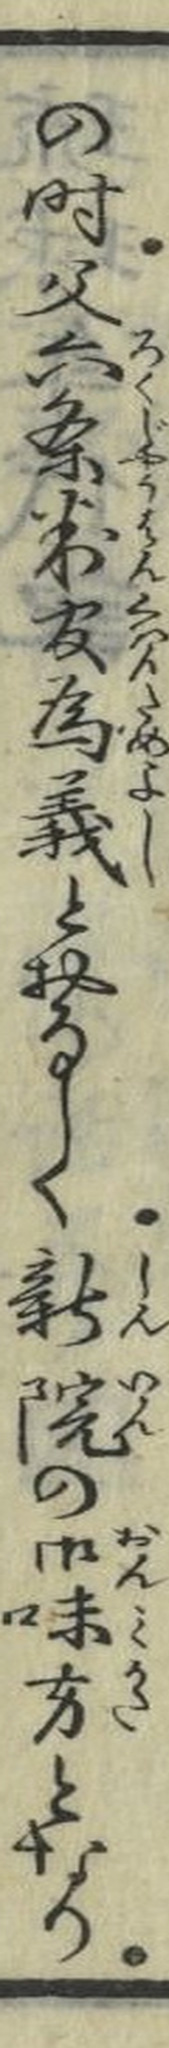の時・父六条判官為義とおなしく・新院の御味方となり・
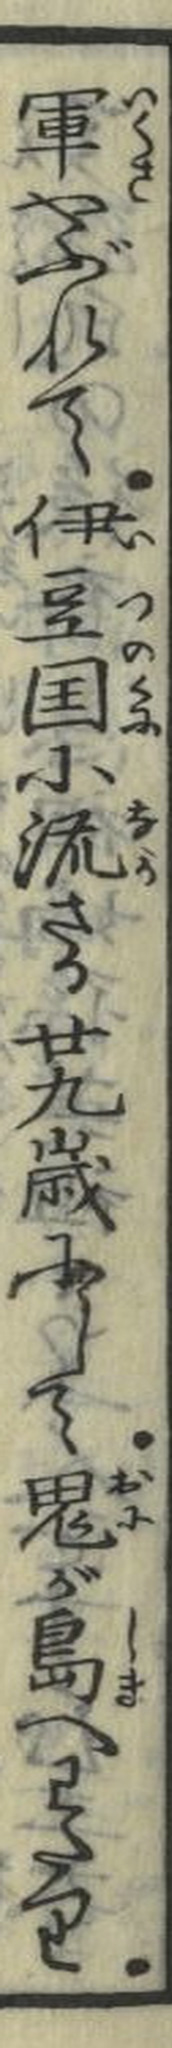軍やぶれて・伊豆国に流さる廿九歳にして・鬼が島へわたり
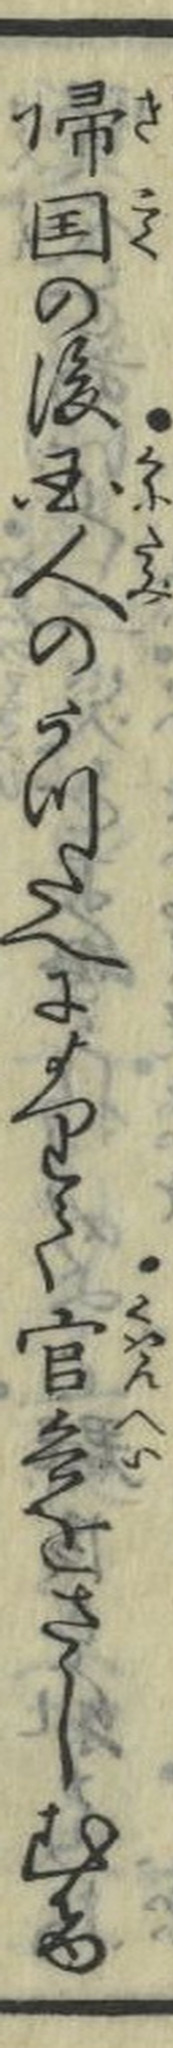帰国の後・国人のうつたへによりて・官兵をさしむけ
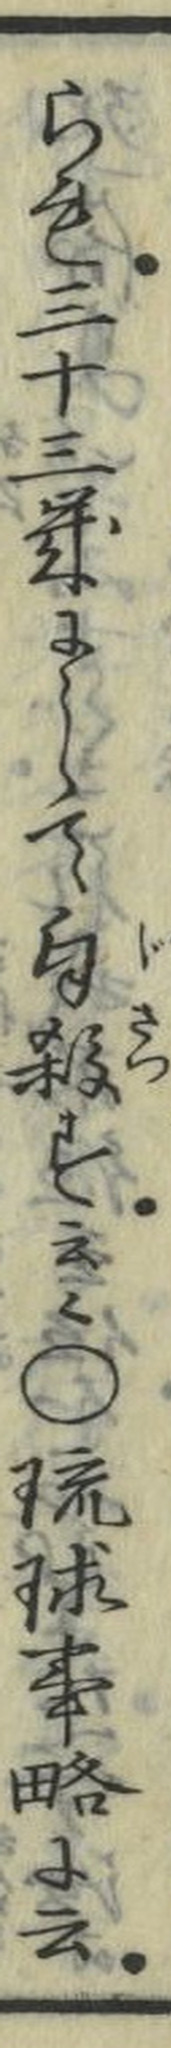られ・三十三歳にして自殺す・云々○琉球本略に云・
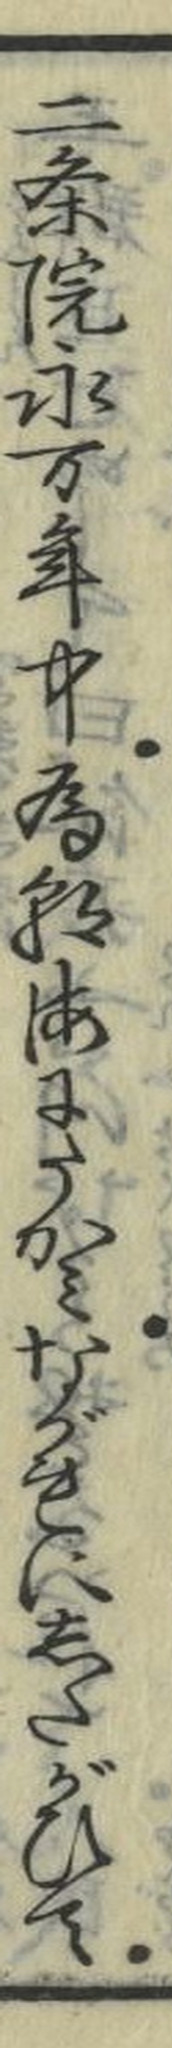二条院永万年中・為朝海にうかみ・ながれにしたがひて・
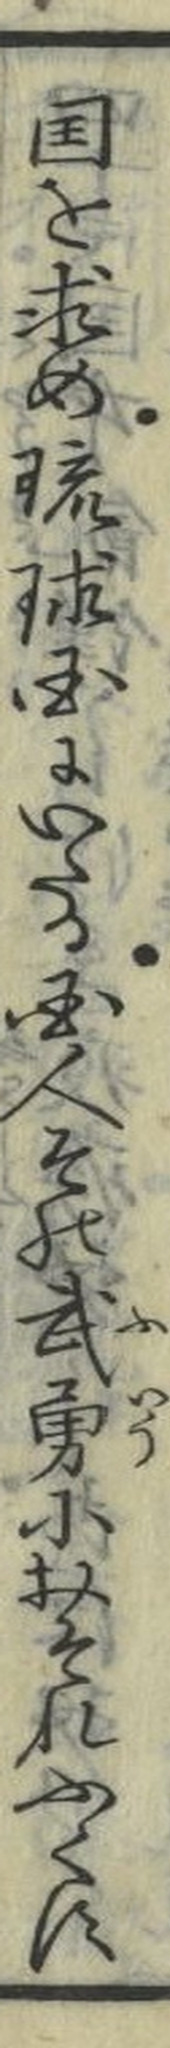国を求め・琉球国にいたる・国人その武勇におそれふくす
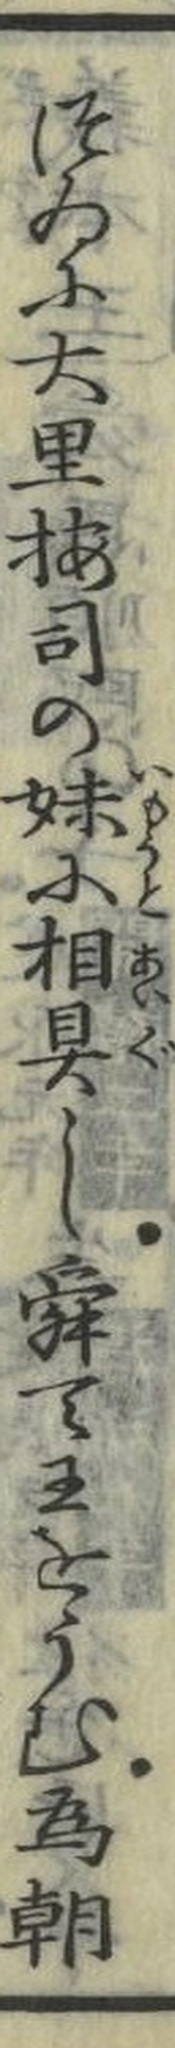つゐに大里按司の妹に相具し・舜天王をうむ・為朝
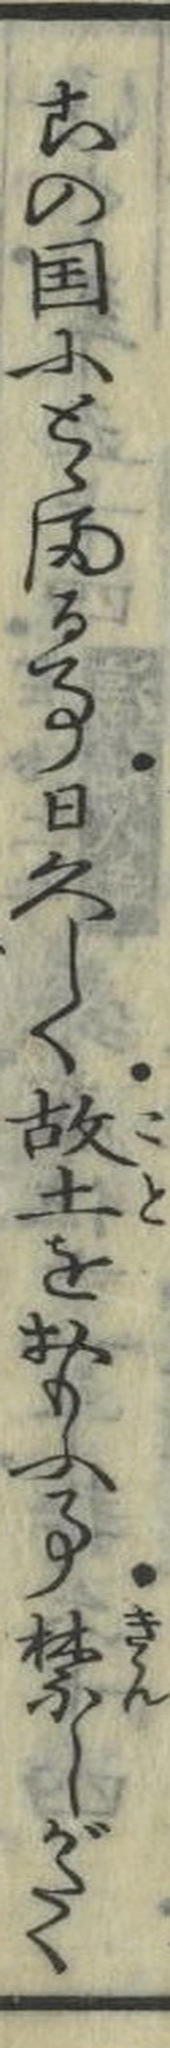この国にとゝまる事・日久しく・故土をおもふ事・禁しがたく

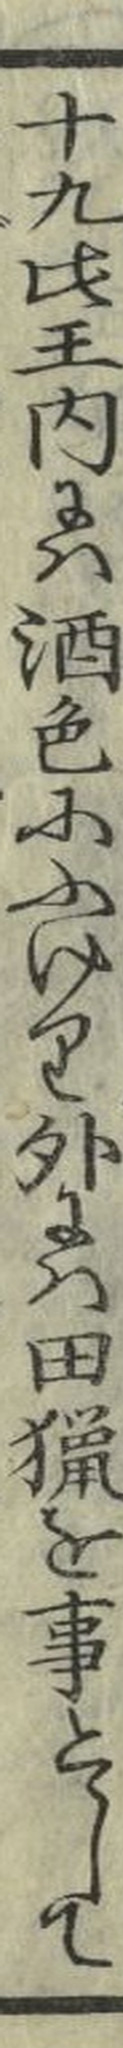十九・此王内には酒色にふけり・外には田猟を事として・
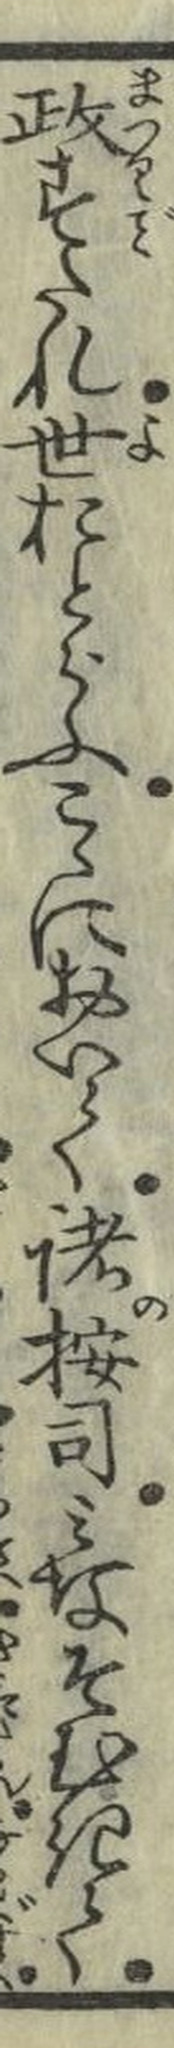政すたれ・世おとらふ・こゝにおいて・諸按司・みなそむきて・
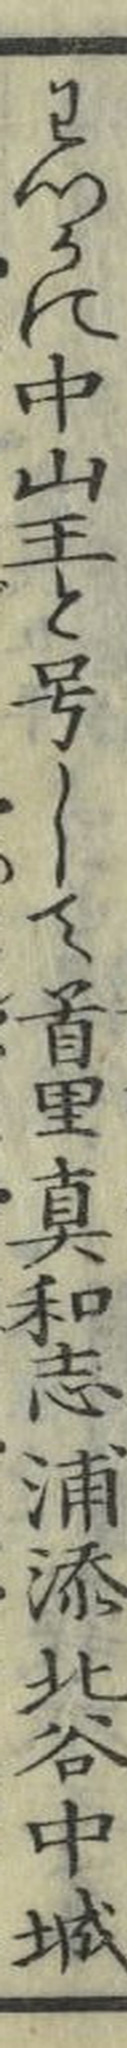わつかに中山王と号して・首里・真和志・浦添・北谷・中城・
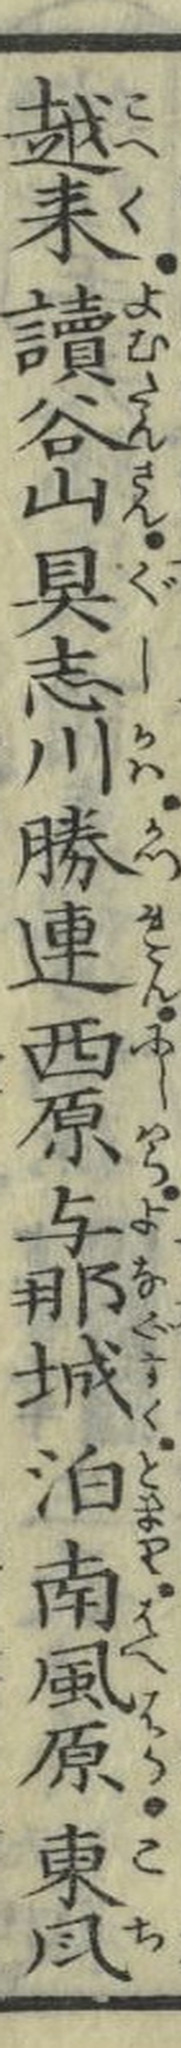越来・讀谷山・具志川・勝連・西原・与那城・泊・南風原・東風
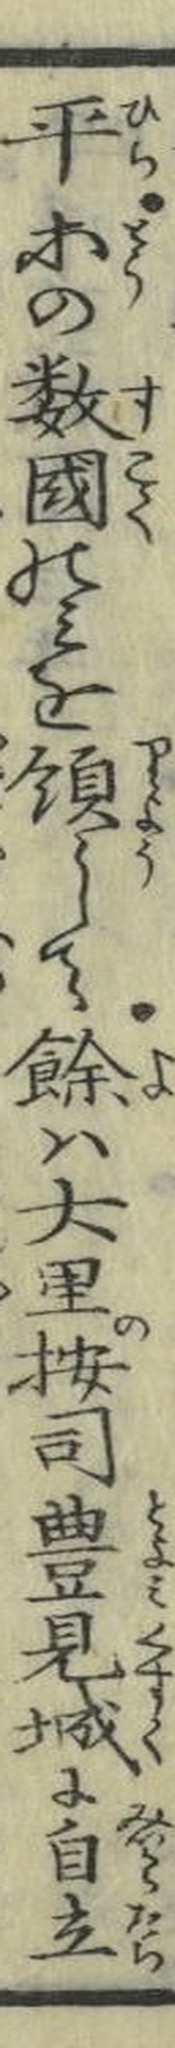平・等の数國のみを領して・餘は大里豊見城に自立
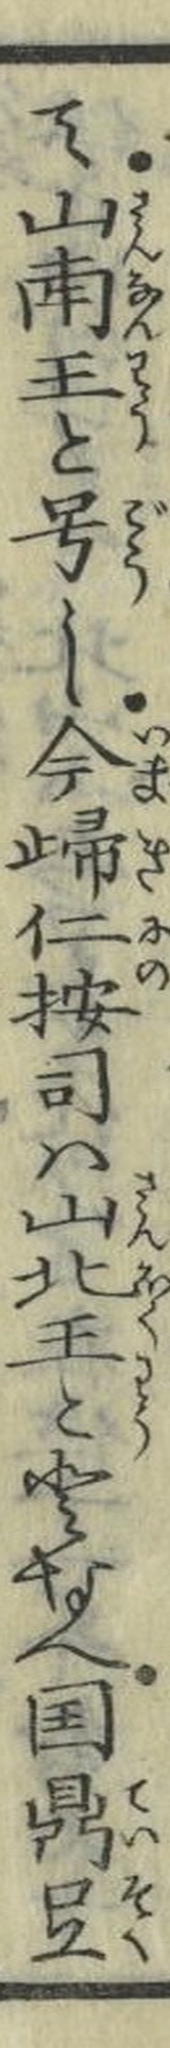て・山南王と号し・今歸仁按司は山北王ととなん・国𪔂足
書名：琉球秊代記 附雑話 全
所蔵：University of the Ryukyus Library
